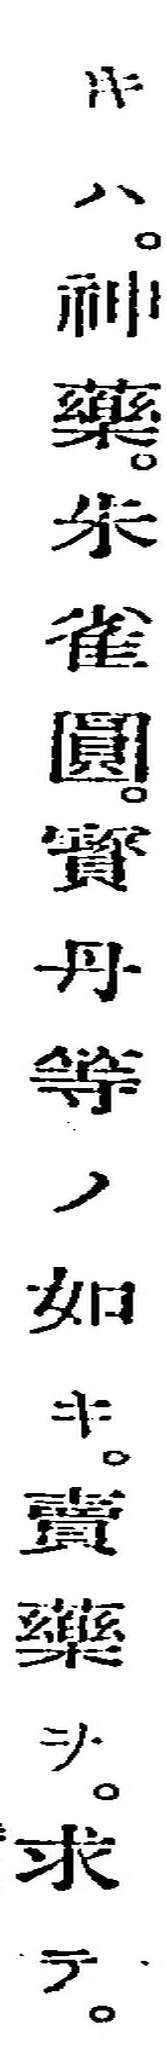ときは。神薬。朱雀円。宝丹等の如き。売薬を。求て。
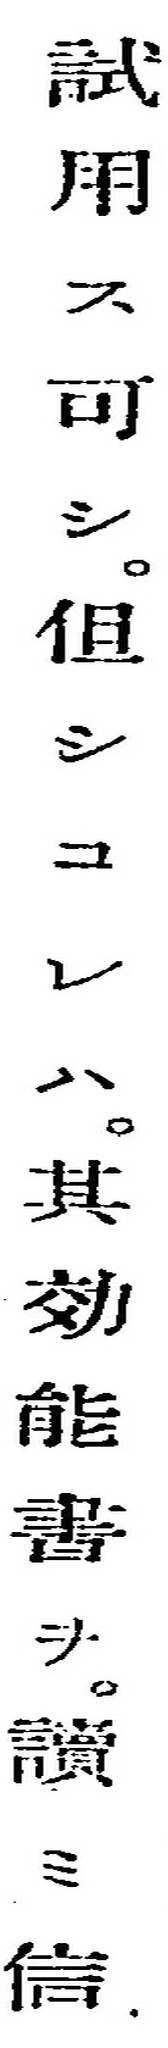試用す可し。但しこれは。其効能書を。読み信
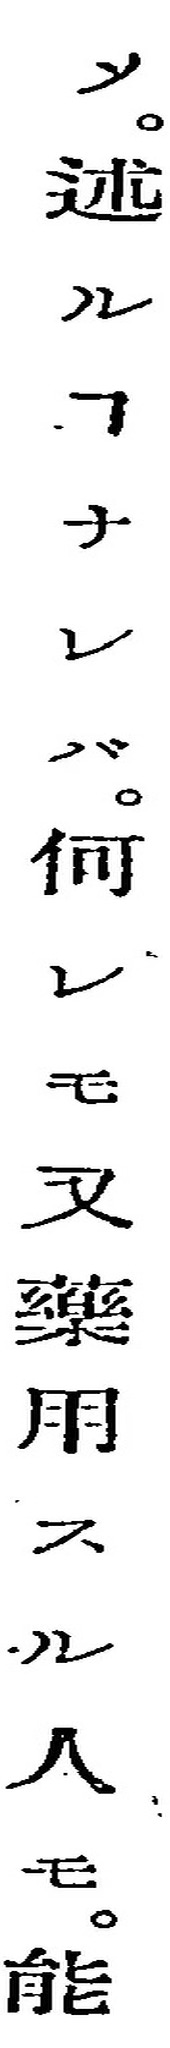して。述ることなれば。何れも又薬用する人も。能
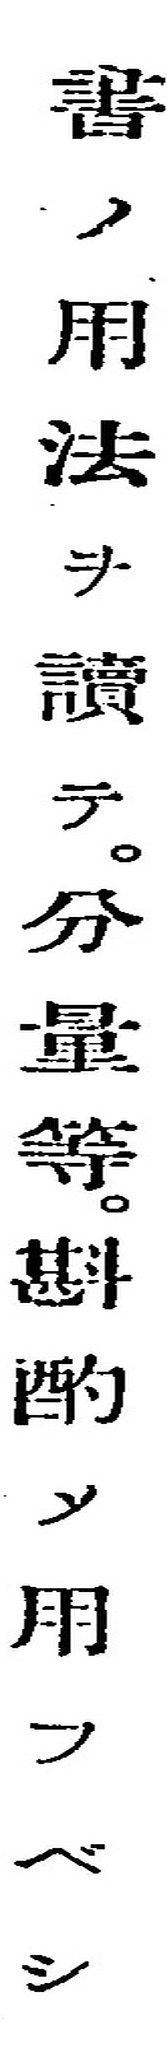書の用法を読て。分量等。斟酌して用ふべし
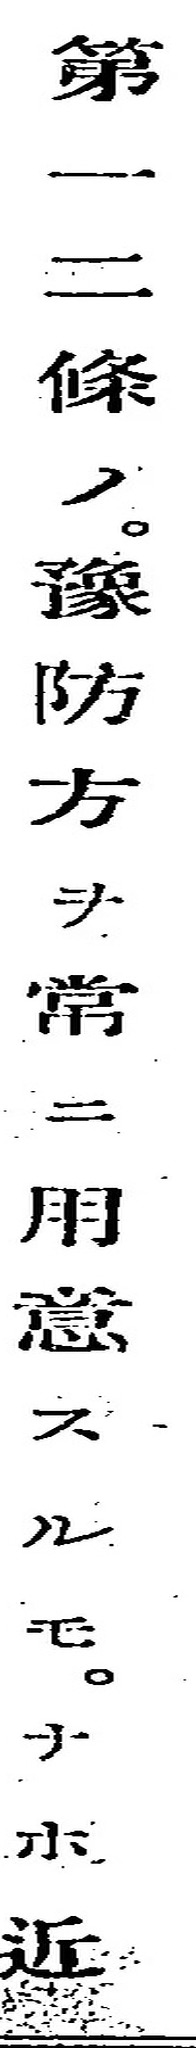第一二条の。予防方を常に用意するも。なほ近

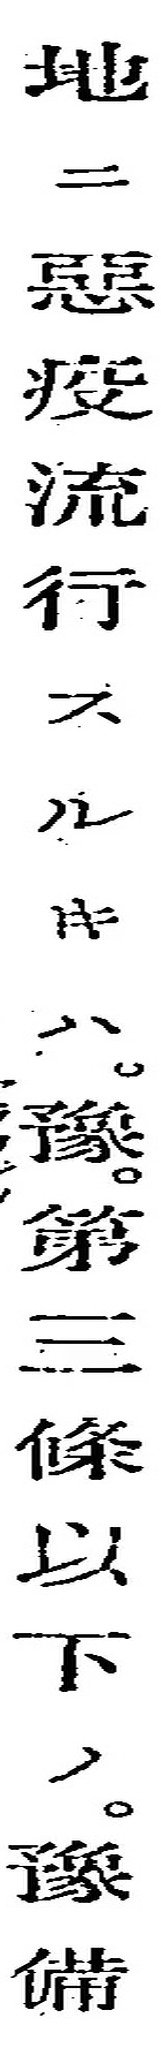地に悪疫流行するときは。豫。第三条以下の。豫備
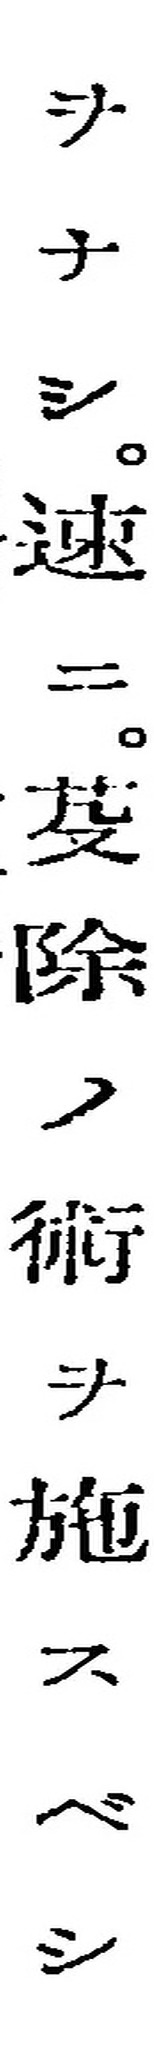をなし。速に。芟除の術を施すべし
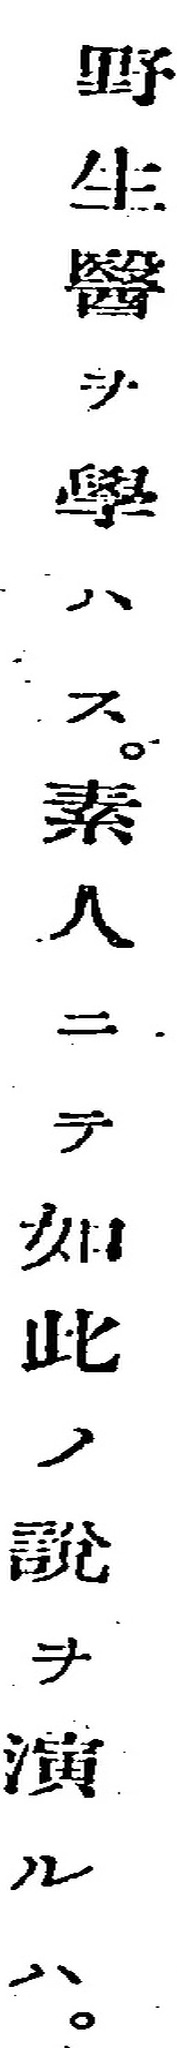野生醫を学はす。素人にて如此の説を演るは。
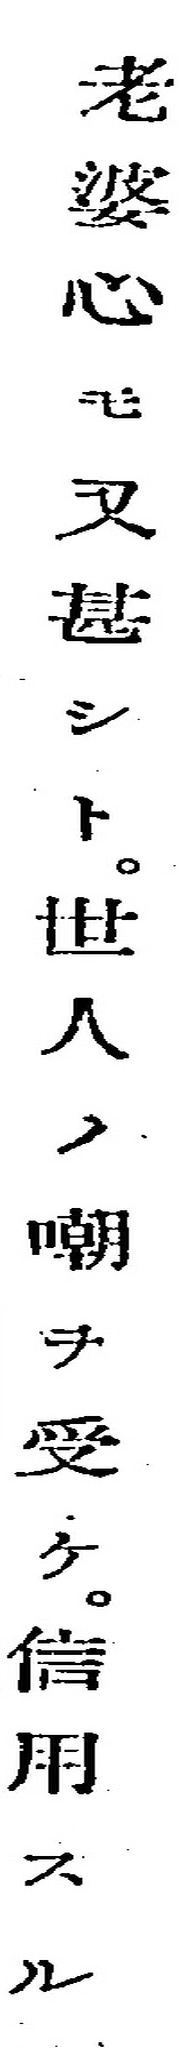老婆心も又甚しと。世人の嘲を受け。信用する
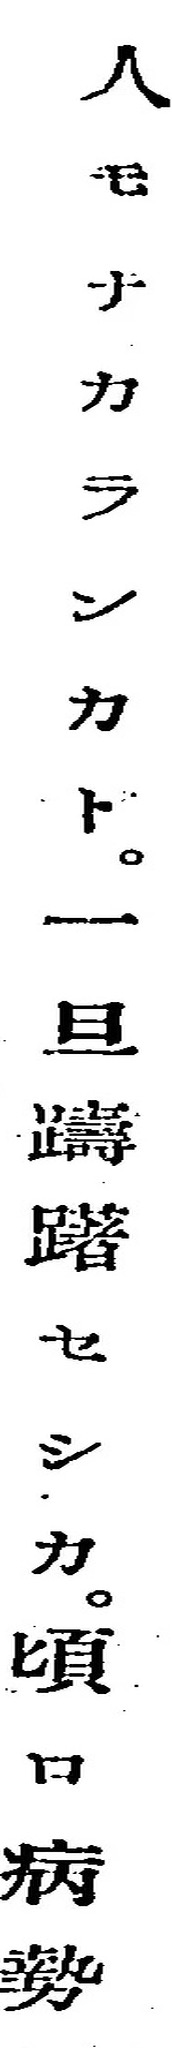人もなからんかと。一旦躊躇せしか。頃ろ病勢
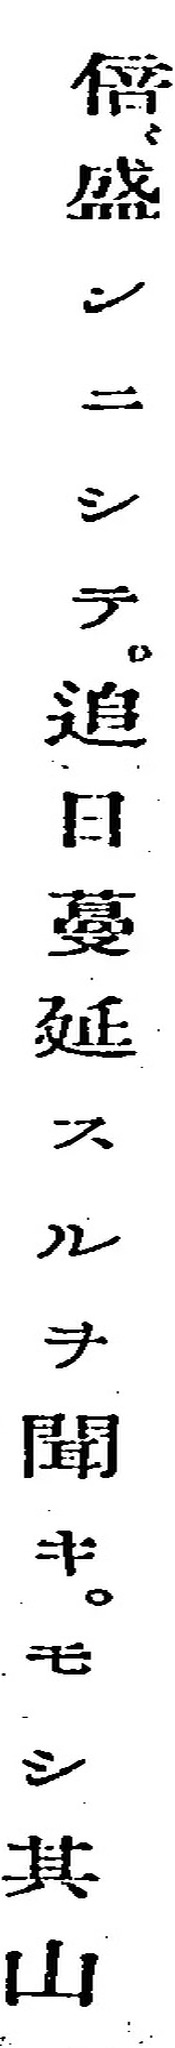倍々盛んにして。追日蔓延するを聞き。もし其山
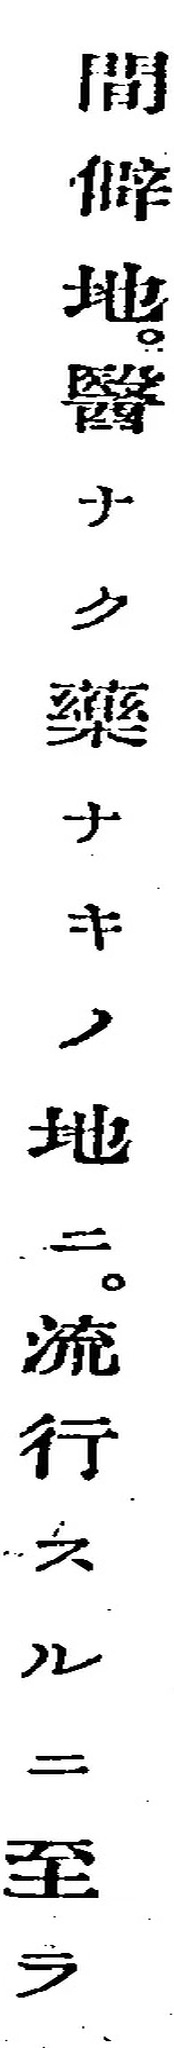間僻地。醫なく薬なきの地に。流行するに至ら
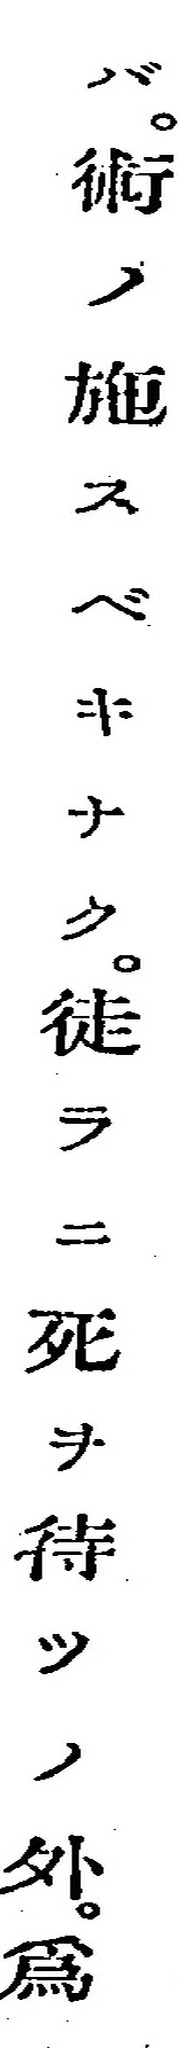ば。術の施しすべきなく。徒らに死を待つの外。為
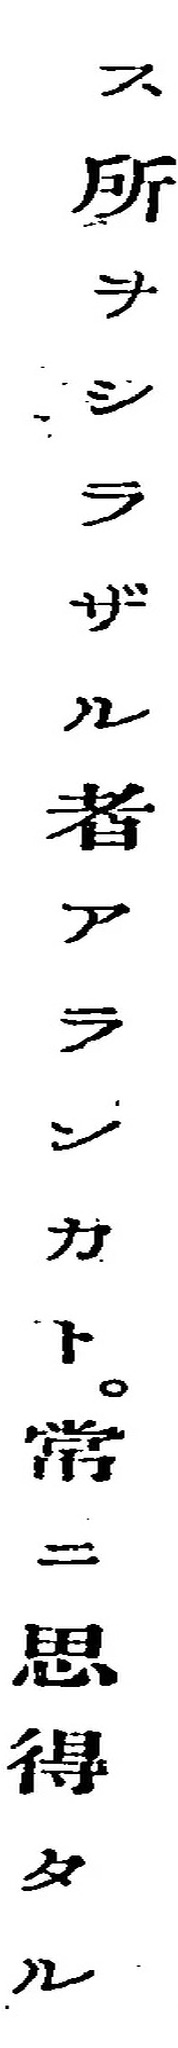す所をしらざる者あらんかと。常に思得たる
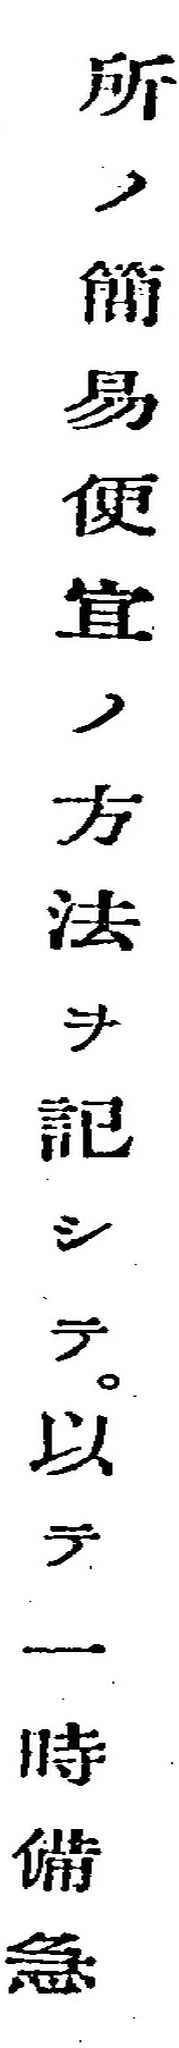所の簡易便宜の方法を記して。以て一時備急
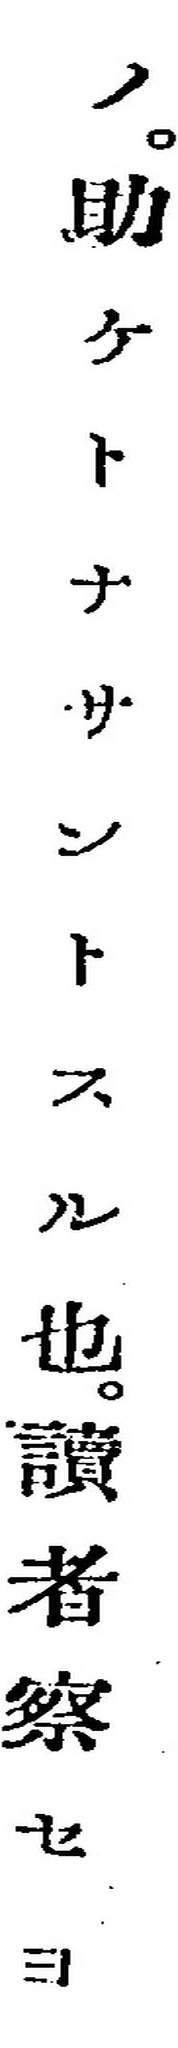の。助けとなさんとする也。読者察せよ
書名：駆疫法 : コレラヲヨケ並ニナホスシカタ
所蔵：国立国会図書館 National Diet Library, JAPAN
